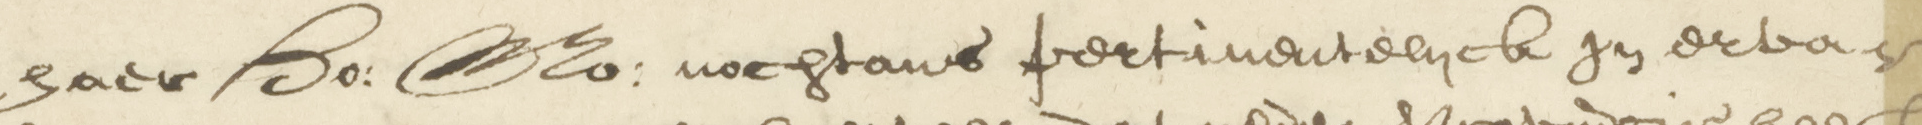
haer Ho:Mo: nochtans pertinentelyck in erva„
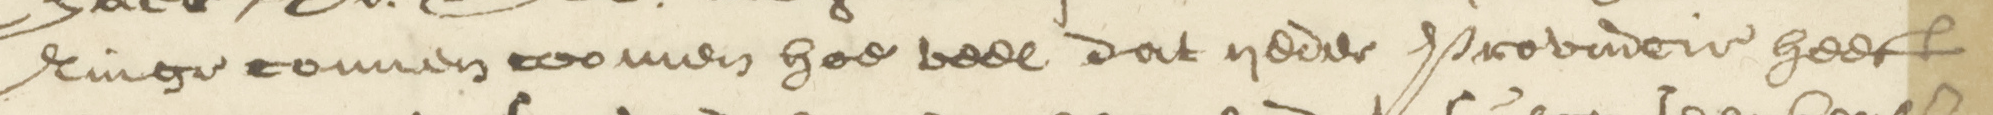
ringe connen coomen hoe veel dat yeder provincie heeft
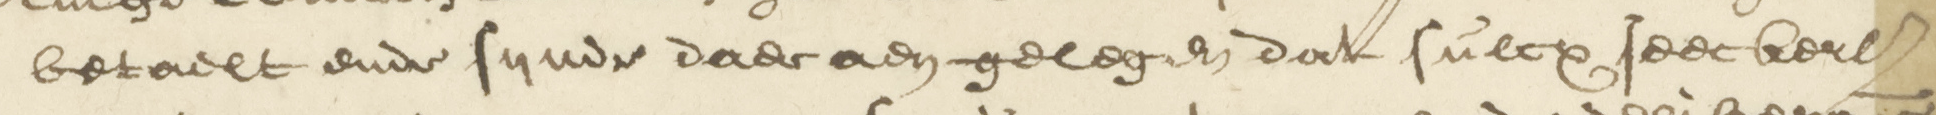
betaelt ende synde daer aen gelegen dat sulcx seeckerl
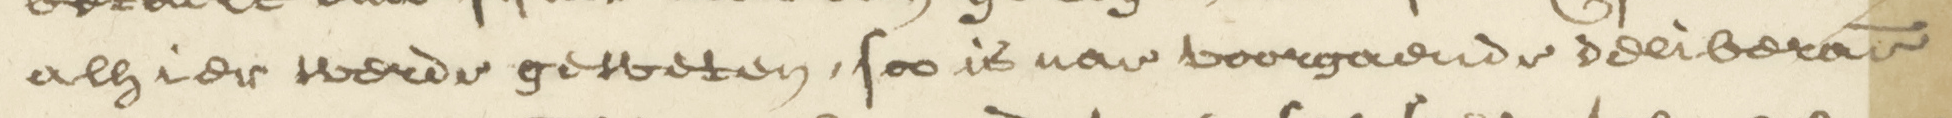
alhier werde geweten, soo is nae voorgaende deliberae
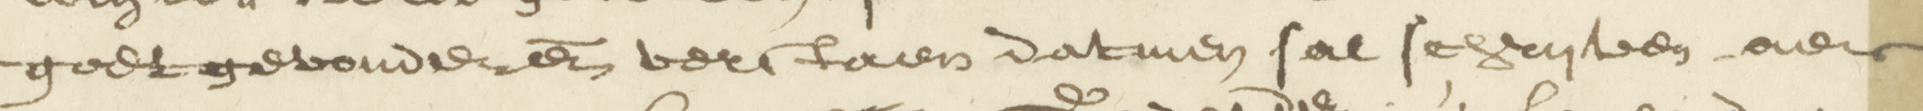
goetgevonden en verstaen datmen sal schryven aen
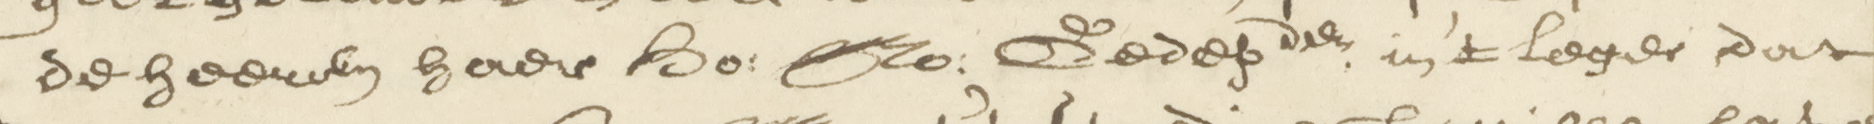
de heeren haer Ho:Mo: Gedepden. in‛ t leger dat
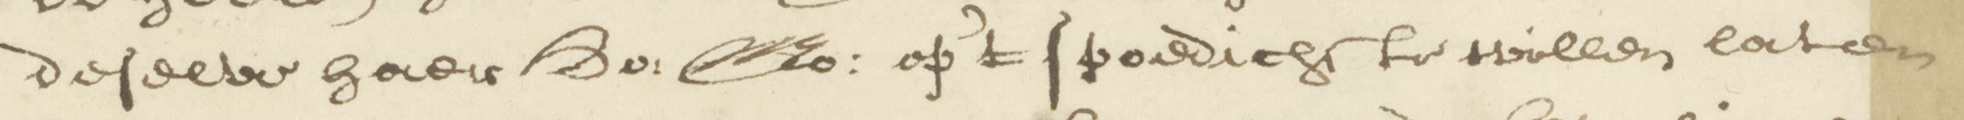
deselve haer Ho:Mo: op 't spoedichste willen laten
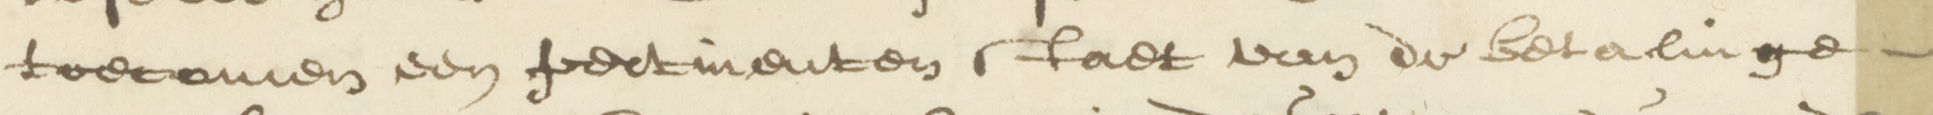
toecomen een pertinenten staet van de betalinge
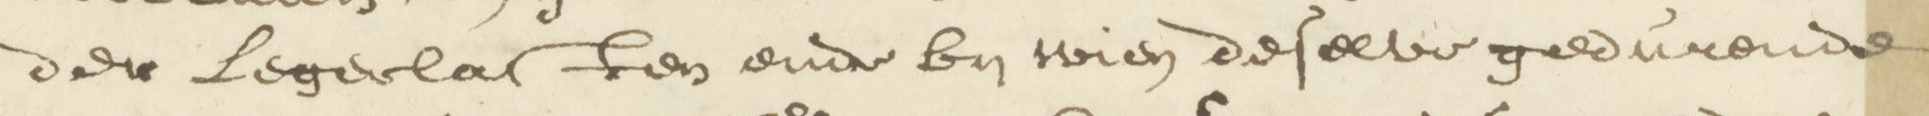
der Legerlasten ende by wien deselve gedurende
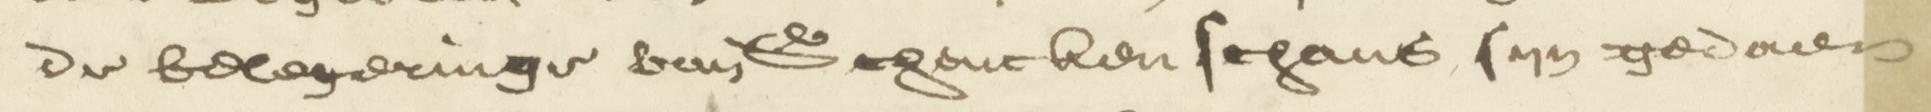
de belegeringe van Schencken schans syn gedaen
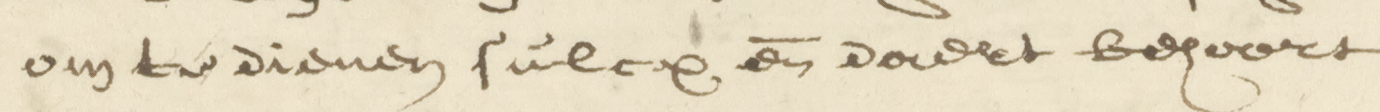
om te dienen sulcx en daert behoort
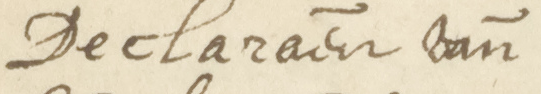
Declaraen van
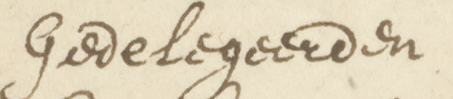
Gedelegeerden
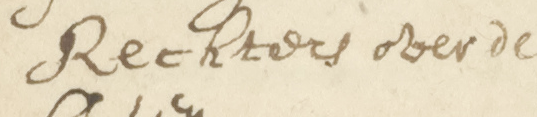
Rechters over de
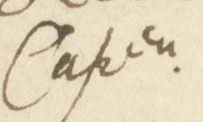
Capen.
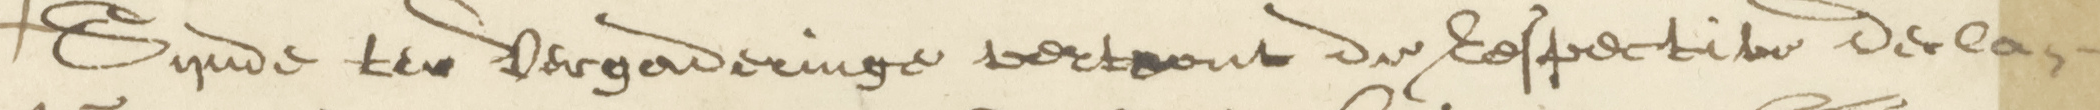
Synde ter Vergaderinge vertoont de respective decla„
